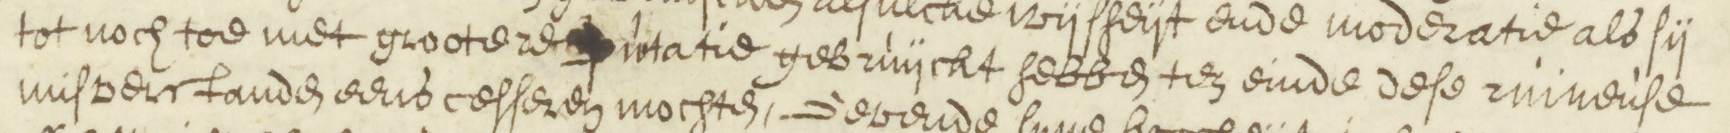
tot noch toe met groote reputatie gebruijckt hebben ten einde dese ruineuse
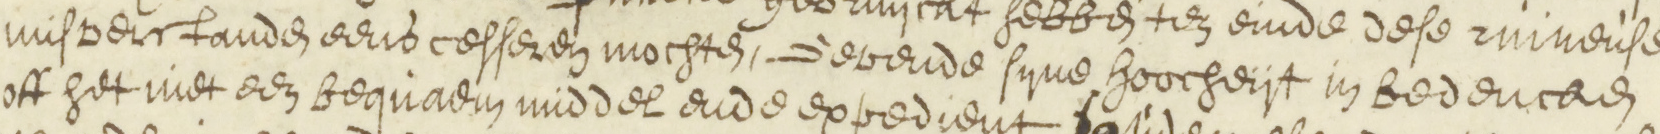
misverstanden eens cesseren mochten. Gevende syne hoocheijt in bedencken
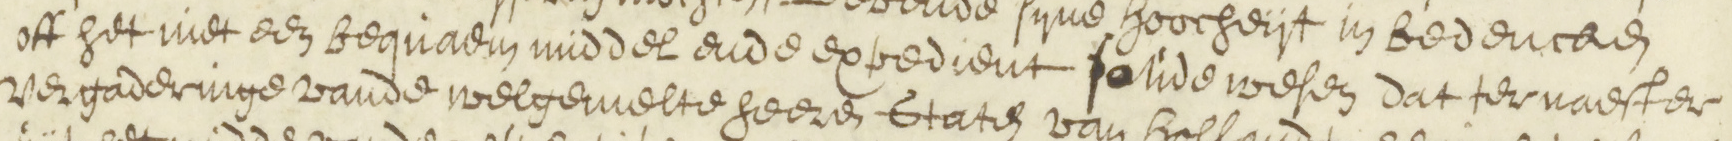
off het niet een bequaem middel ende expedient soude wesen dat ter naester
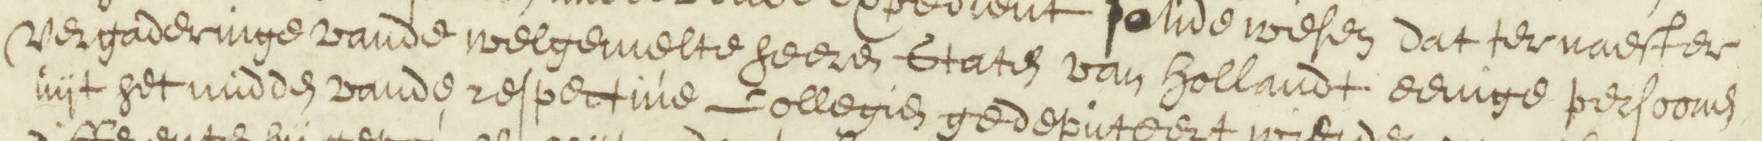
Vergaderinge vande welgemelte heeren Staten van Hollandt eenige persoonen
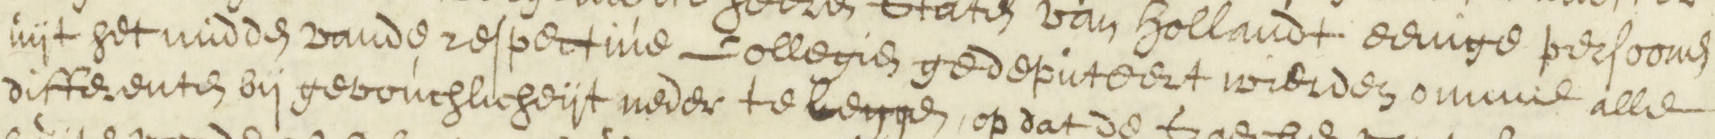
uijt het midden vande respectiue Collegien gedeputeert wierden omme alle
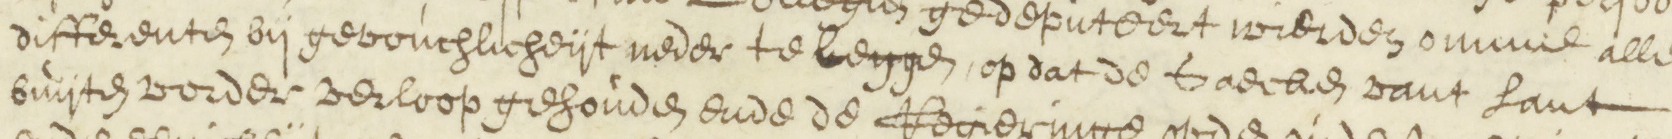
differenten bij gevouchlicheijt neder te leggen, op dat de Saecken vant Lant
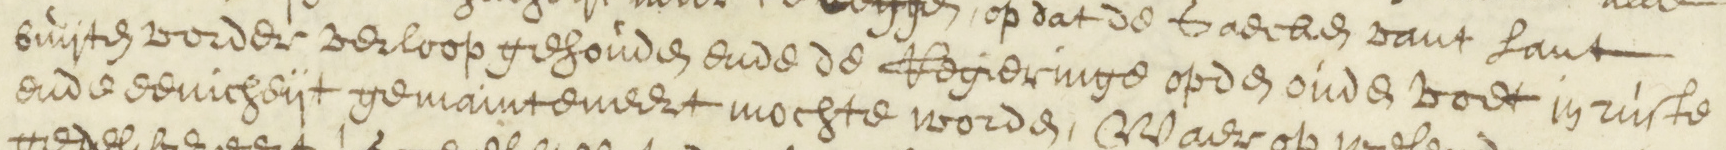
buijten vorder verloop gehouden ende de Regieringe opden ouden voet in ruste
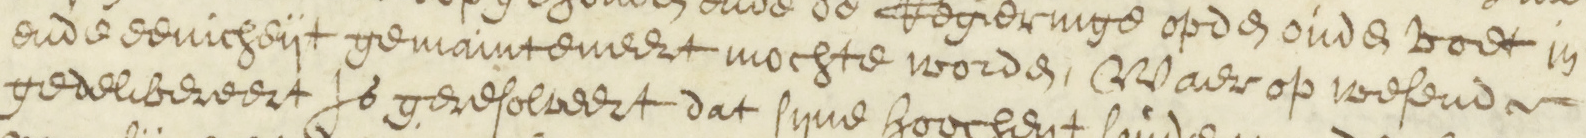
ende eenicheijt gemainteneert mochte worden. Waerop wesende
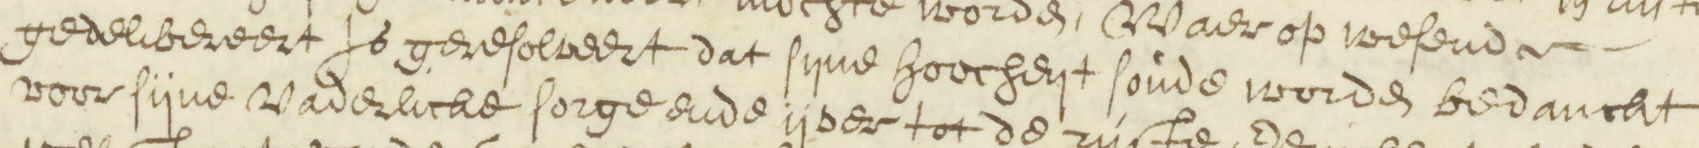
gedelibereert Is geresolveert dat syne Hoocheyt soude worden bedanckt
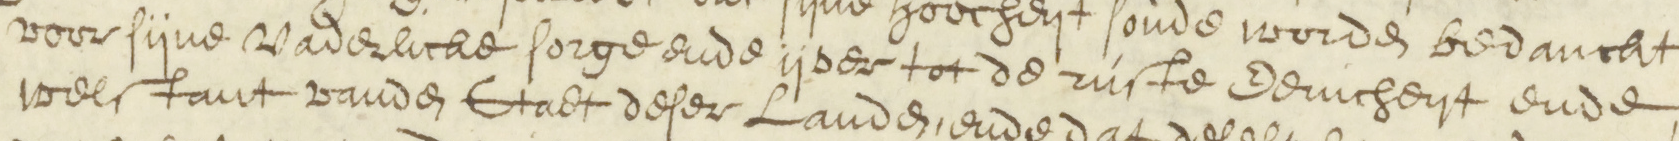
voor sijne Vaderlicke sorge ende ijver tot de ruste Eenicheyt ende
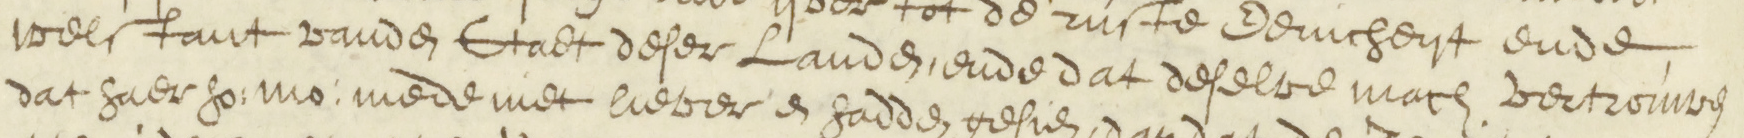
welstant vanden Staet deser Landen, ende dat deselve mach vertrouwen
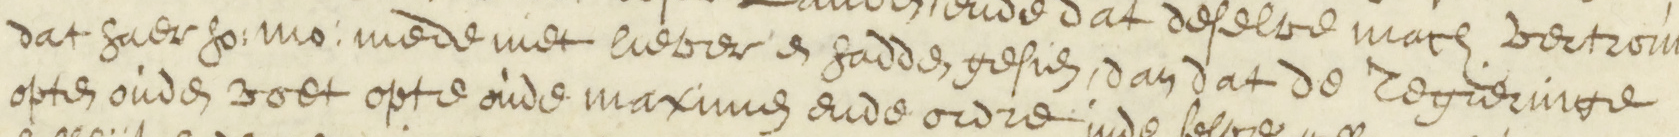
dat haer ho:Mo: mede met liever en hadden gesien, dan dat de regieringe
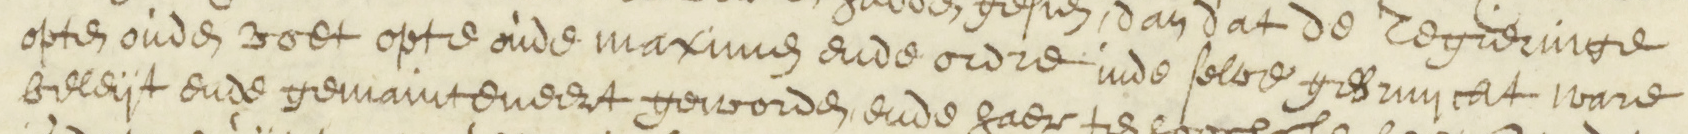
opten ouden voet opte oude maximen ende ordre inde selve gebruyckt ware
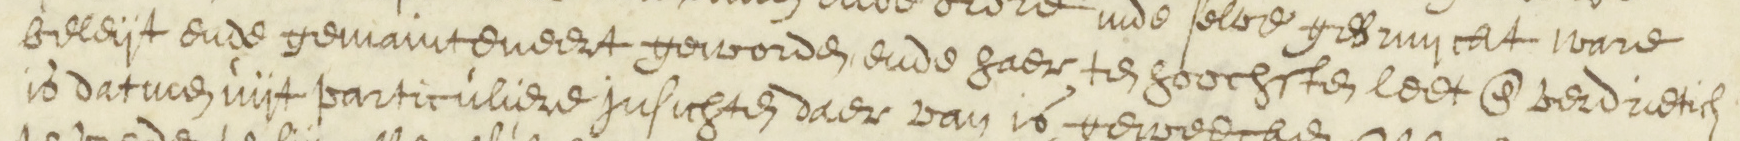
beleijt ende gemainteneert geworden, ende haer ten hoochsten leet & verdrietich
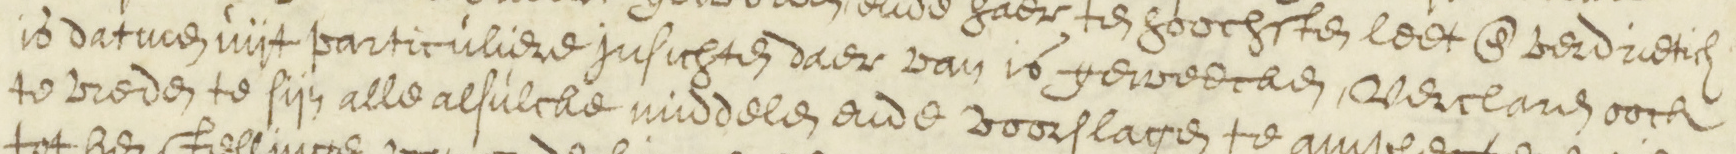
is datmen uijt particuliere insichten daer van is geweecken. Verclaren oock
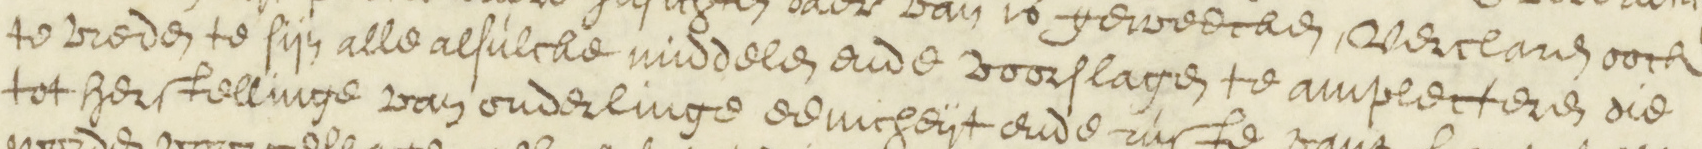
te vreden te sijn alle alsulcke middelen ende voorslagen te amplecteren die
